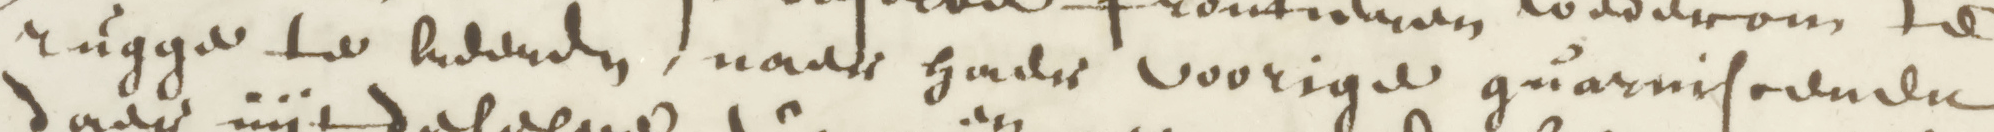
rugge te keeren, naer haer voorige guarnisoenen
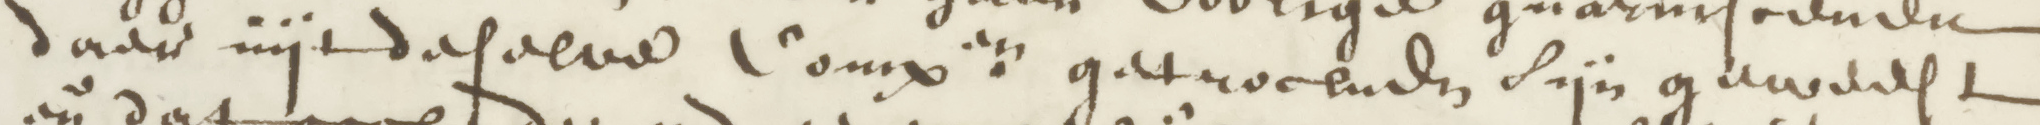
daer uijt deselve Compen. getrocken sijn geweest
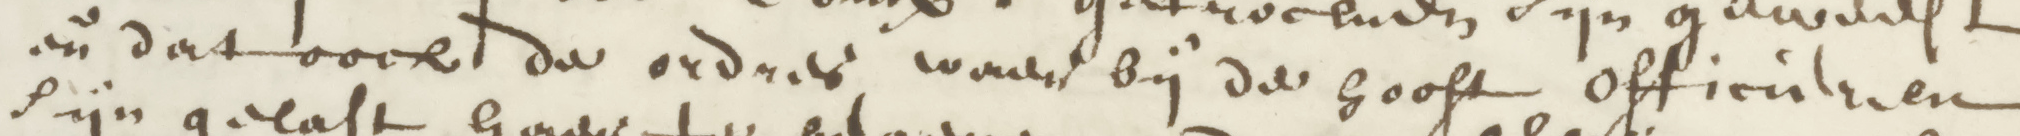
en dat oock de ordres waer bij de hooft officieren
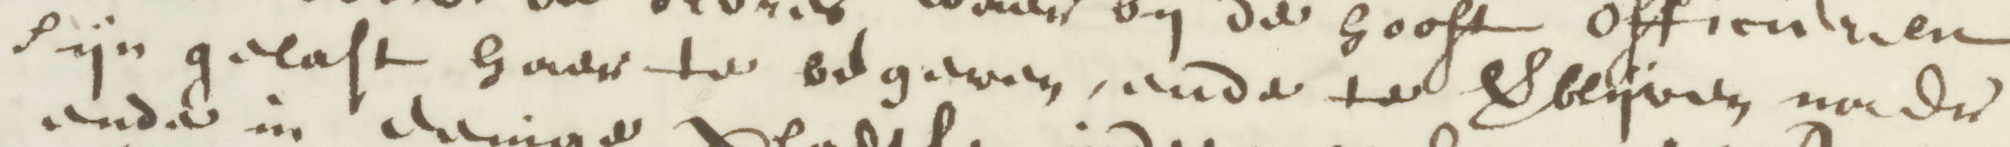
sijn gelast haer te begeven, ende te vblijven naer
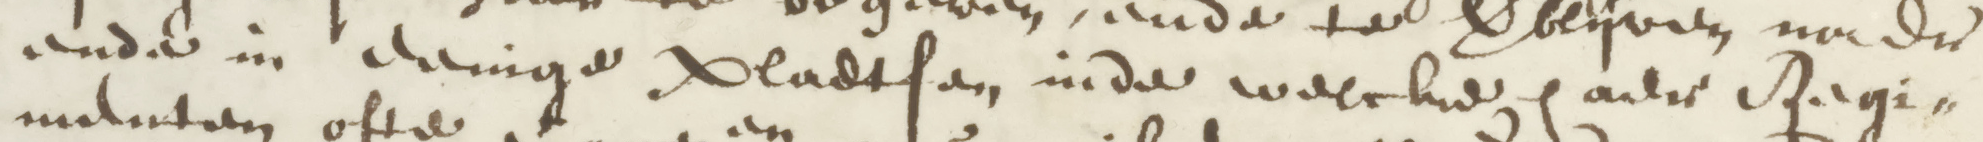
ende in eenige Plaetsen inde welcke haer Regi„
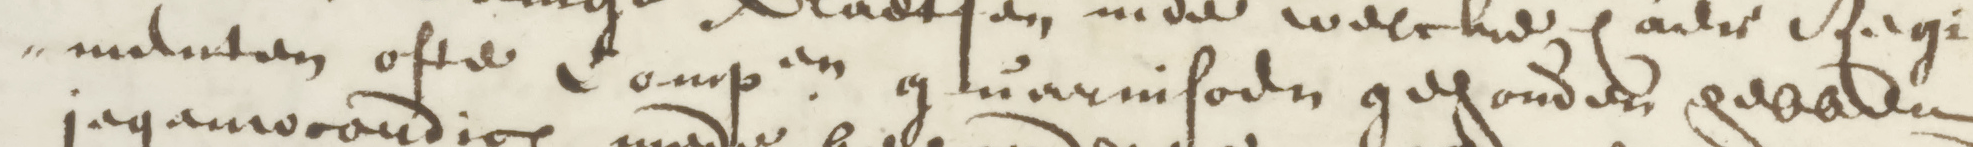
„menten ofte Compen. guarnisoen gesonden hebben
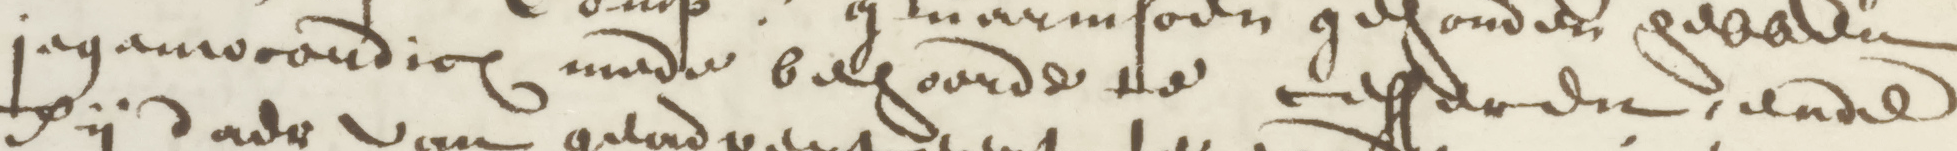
jegenwoordich mede behoorde te cesseren, ende
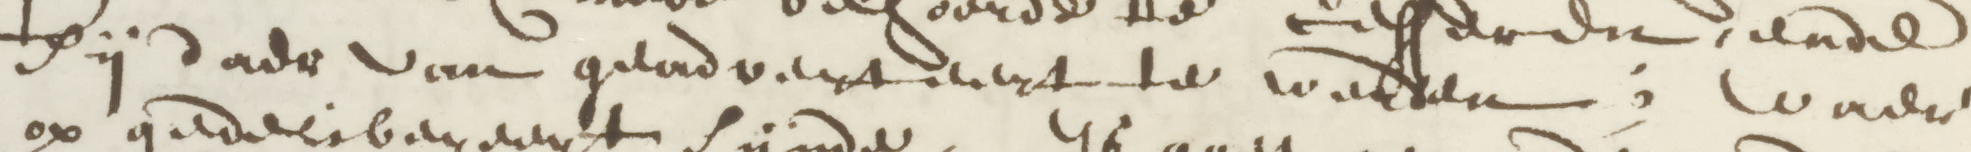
sij daer van geadverteert te werden: Waer
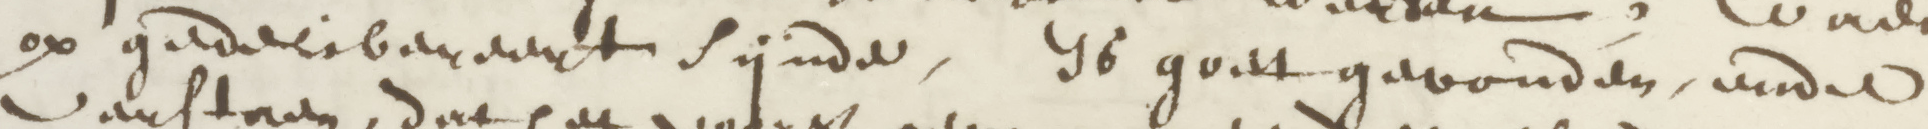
op gedelibereert sijnde, is goetgevonden, ende
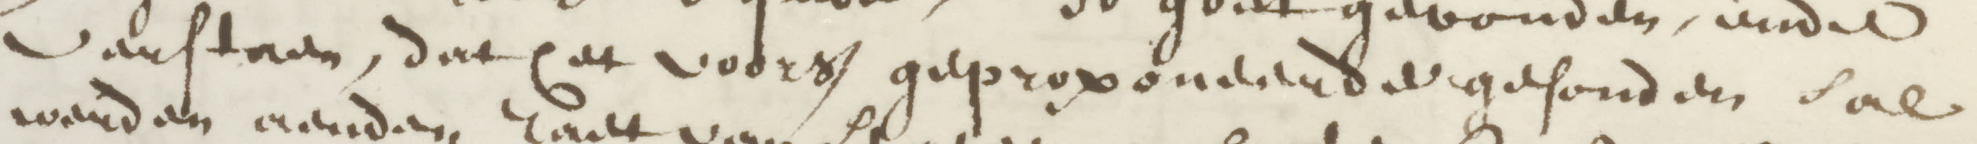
verstaen, dat het voors geproponeerde gesonden sal
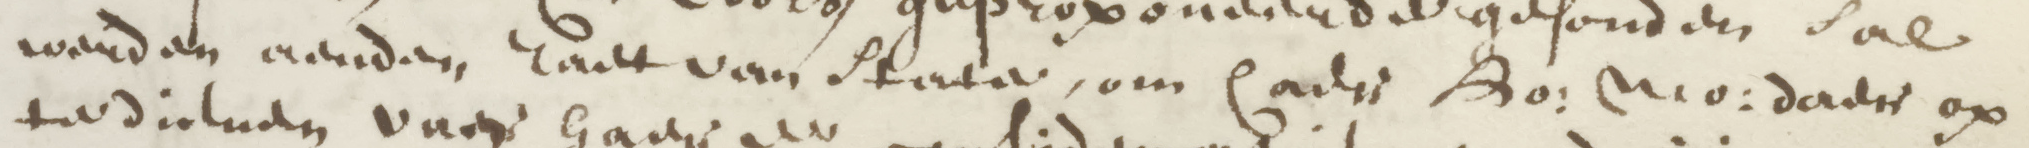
werden aenden Raet van State, om haer Ho:Mo: daer op
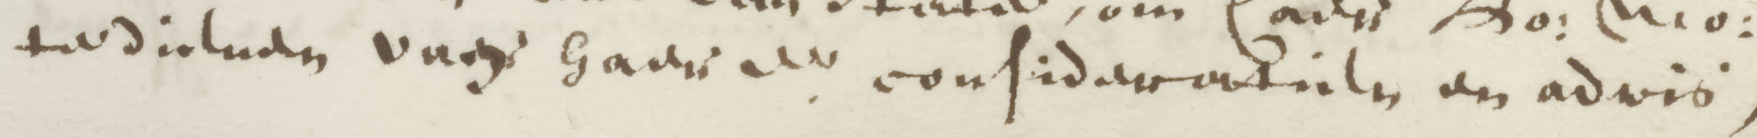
te dienen vaer haer E. consideratien en advis.
